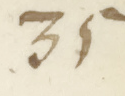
35
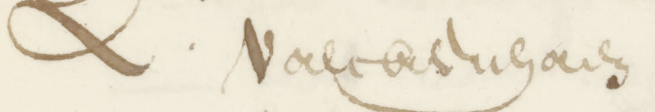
Lt. Valckenhaen
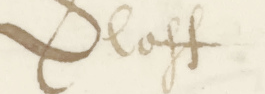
Vloff.
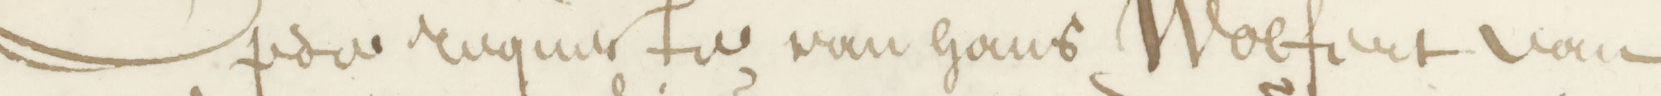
Opde requeste van hans Wolfert van
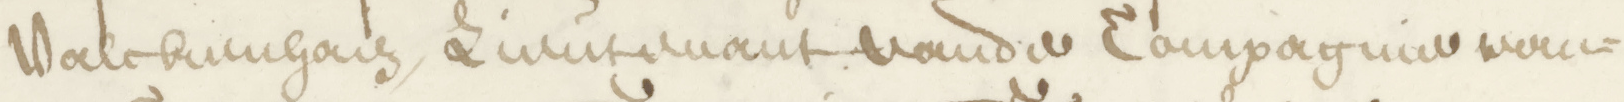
Valckenhaen, Lieutenant vande Compagnie van=
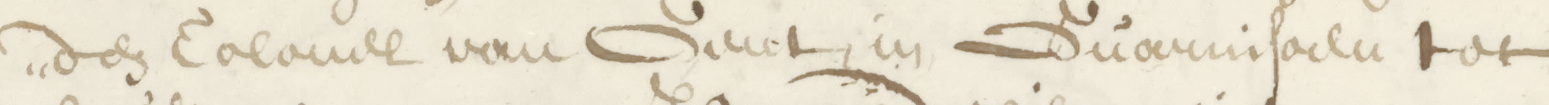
„den Colonel van Gent, in Guarnisoen tot
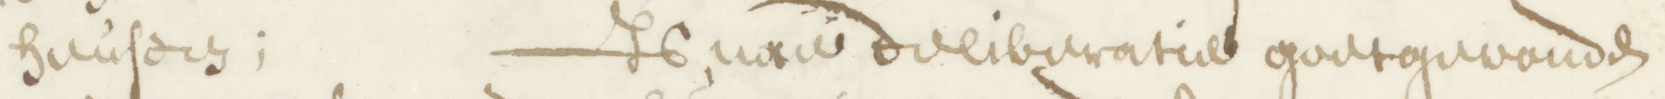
heusden: Is nae deliberatie goetgevonden
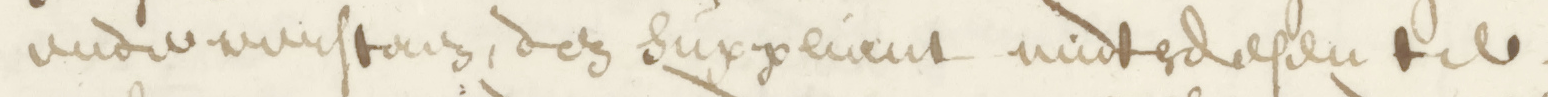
ende verstaen, den Suppliant midtsdesen te
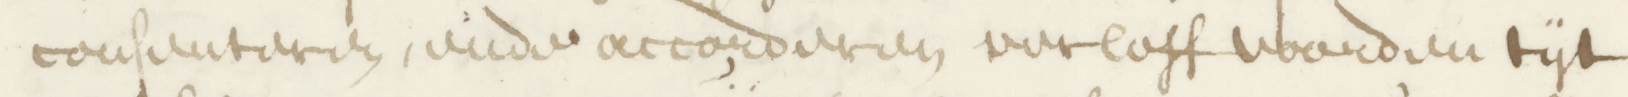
consenteren, ende accorderen verloff voor den tijt
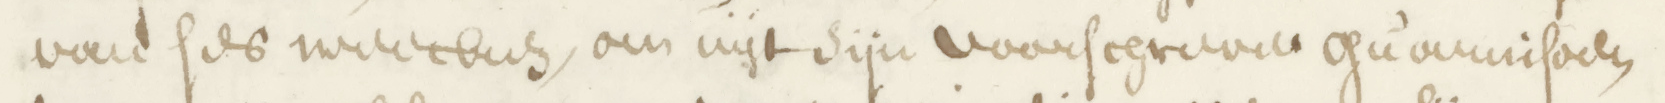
van ses weecken, om uijt sijn voorschreve Guarnisoen
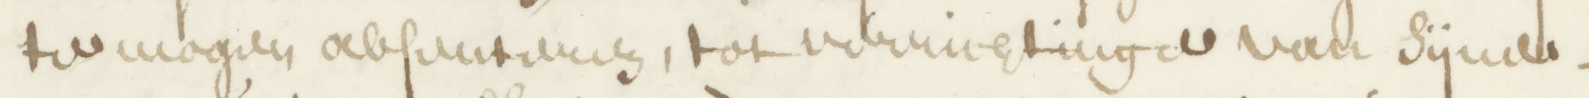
te mogen absenteren, tot verrichtinge van sijne
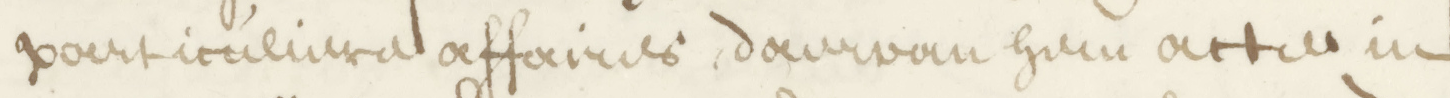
particuliere affaires, daervan hem acte in
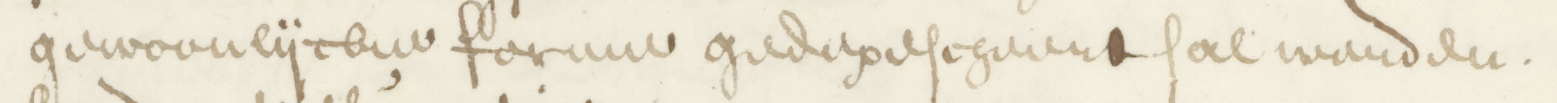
gewoonlijcke forme gedepescheert sal werden.
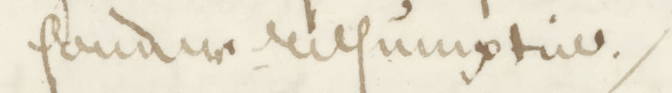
sonder resumptie.
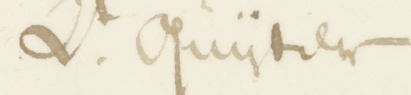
Lt. Quijter
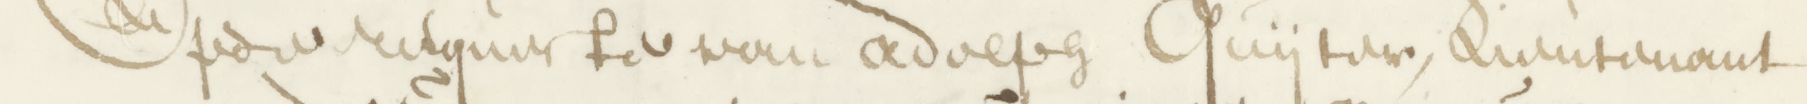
Opde requeste van Adolph Quijter, Lieutenant
